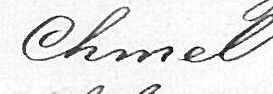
Chmel
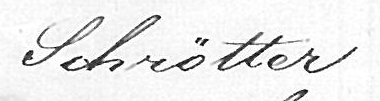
Schrötter
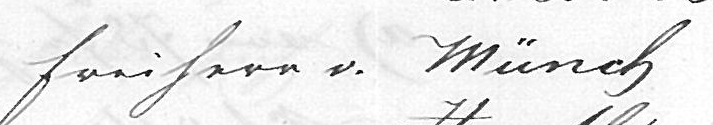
Freiherr v. Münch
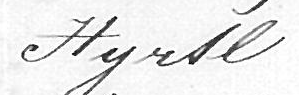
Hyrtl
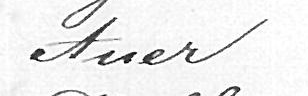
Auer
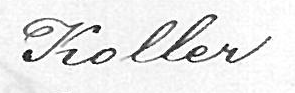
Koller
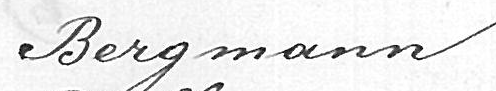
Bergmann
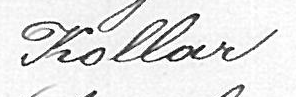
Kollar
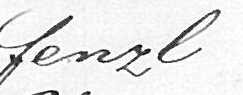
Fenzl
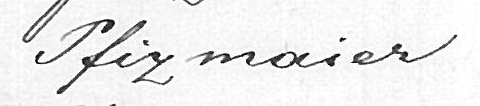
Pfizmaier
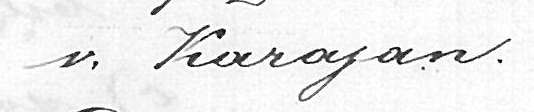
v. Karajan.
